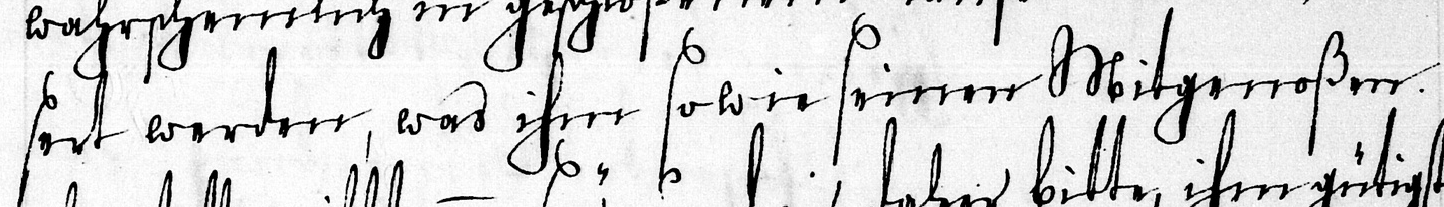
ßert werden, was ihm sowie seinen Mitgenoßen
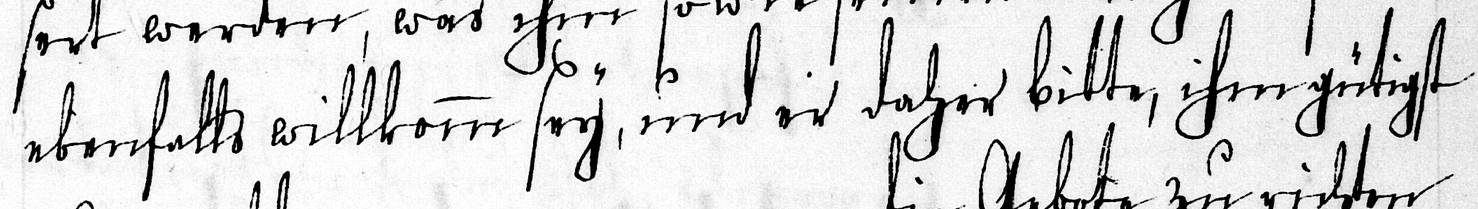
ebenfalls willkomm sey, und er daher bitte, ihm gütigst
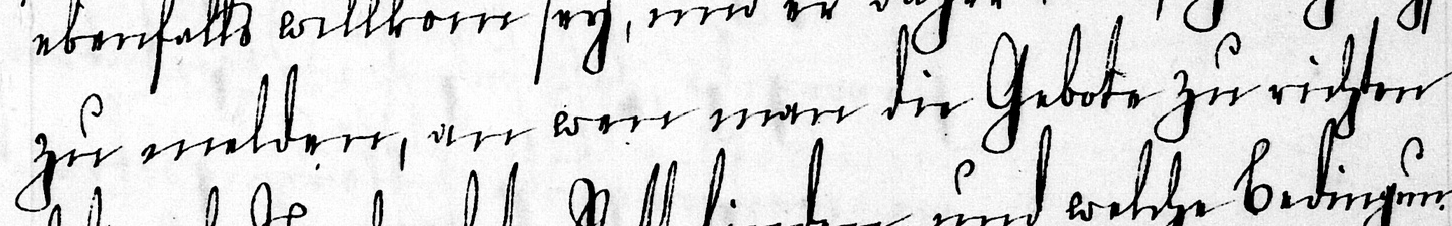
zu melden, an wen man die Gebote zu richten
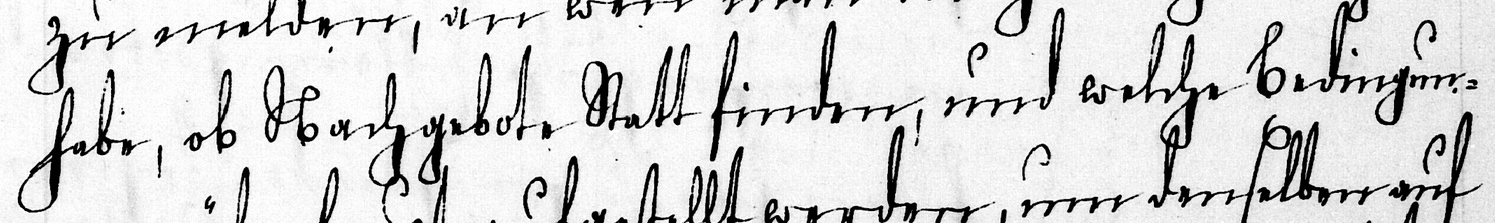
habe, ob Nachgebote Statt finden, und welche Bedingun¬
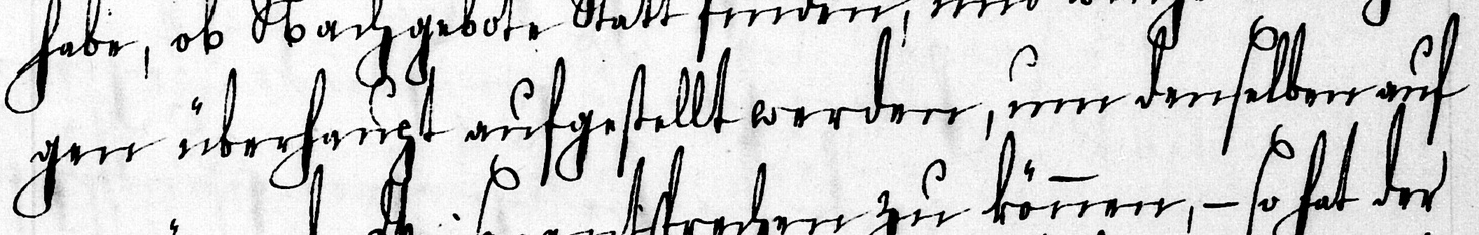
gen überhaupt aufgestellt werden, um denselben auf
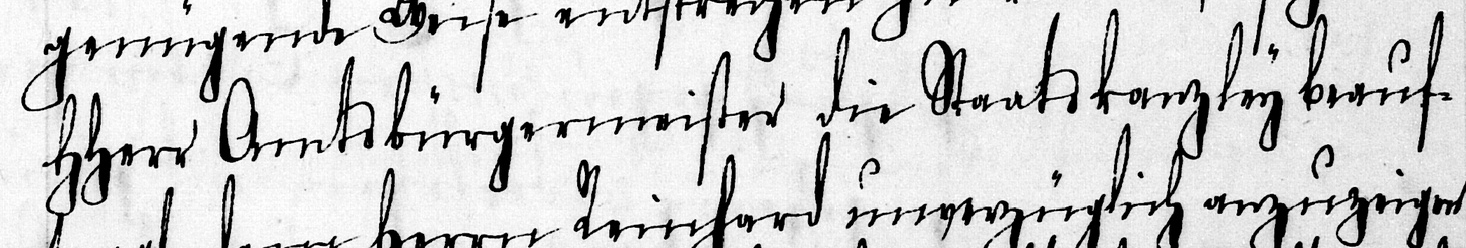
HHerr Amtsbürgermeister die Staatskanzley beauf¬
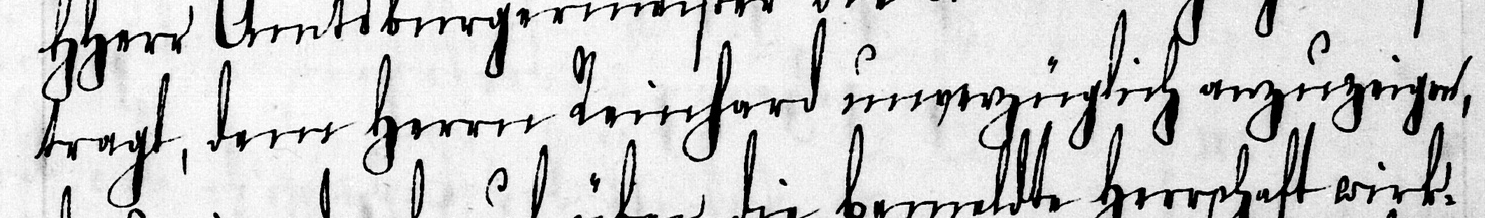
tragt, dem Herrn Reinhard unverzüglich anzuzeigen,
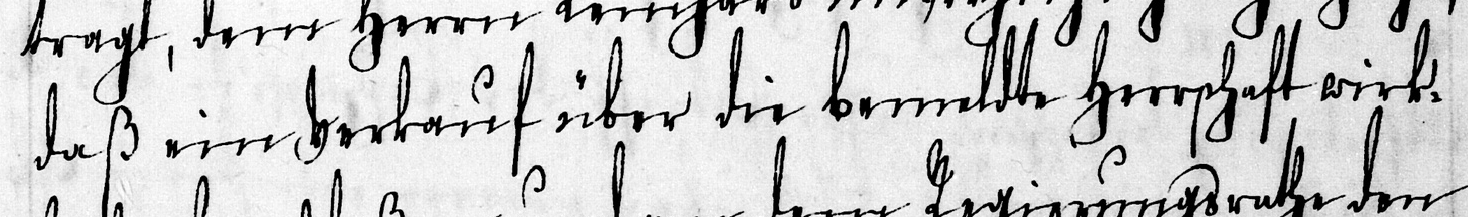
daß ein Verkauf über die bemeldte Herrschaft wirk¬
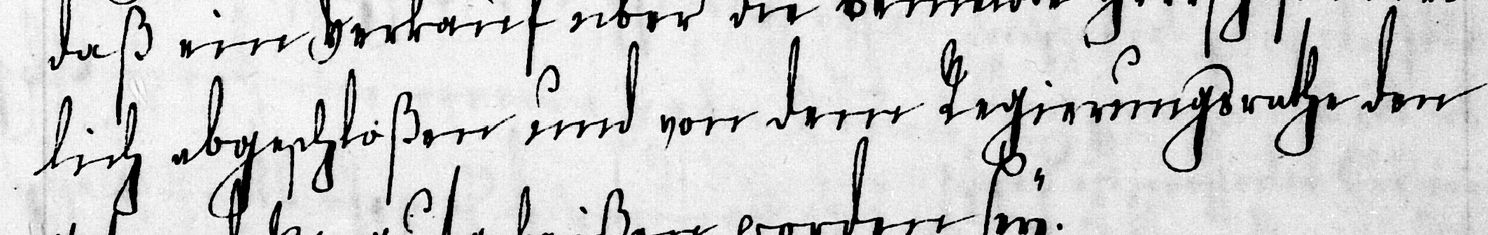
lich abgeschloßen und von dem Regierungsrathe den
